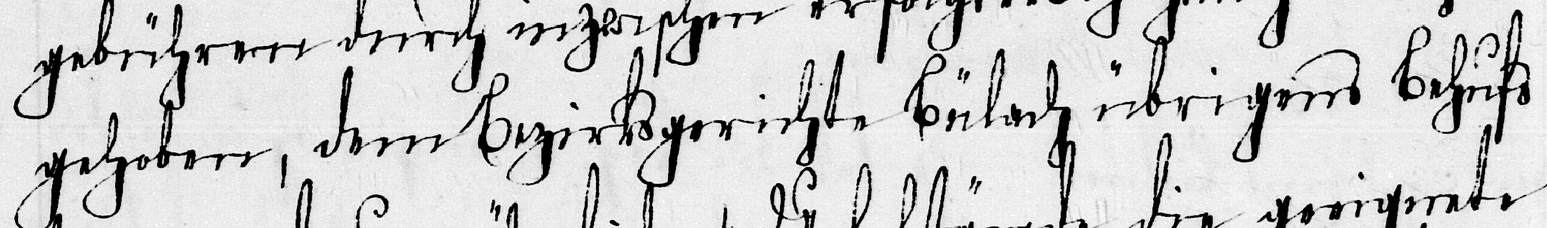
gehoben, dem Bezirksgerichte Bülach übrigens behufs
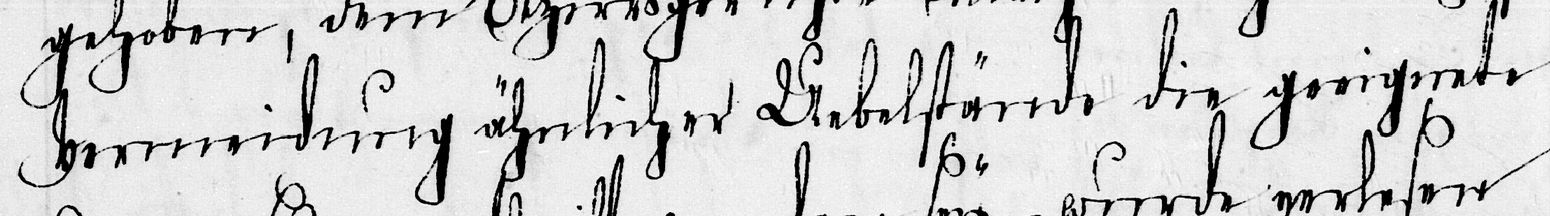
Vermeidung ähnlicher Uebelstände die geeignete
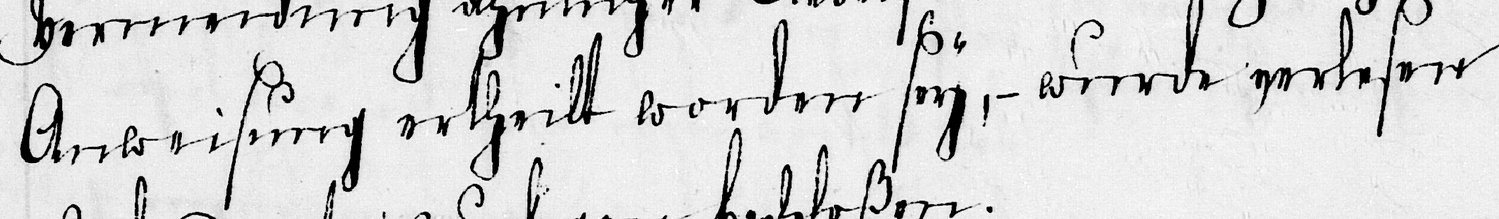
Anweisung ertheilt worden sey, – wurde verlesen
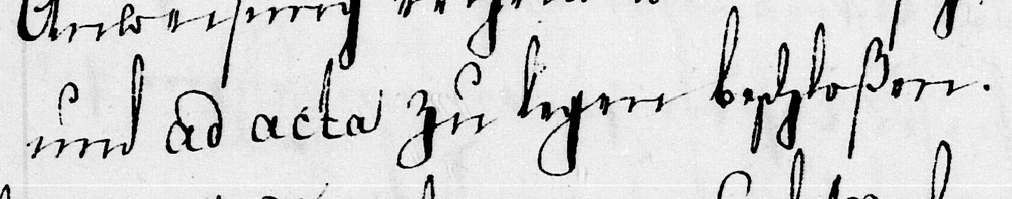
und ad acta zu legen beschloßen.
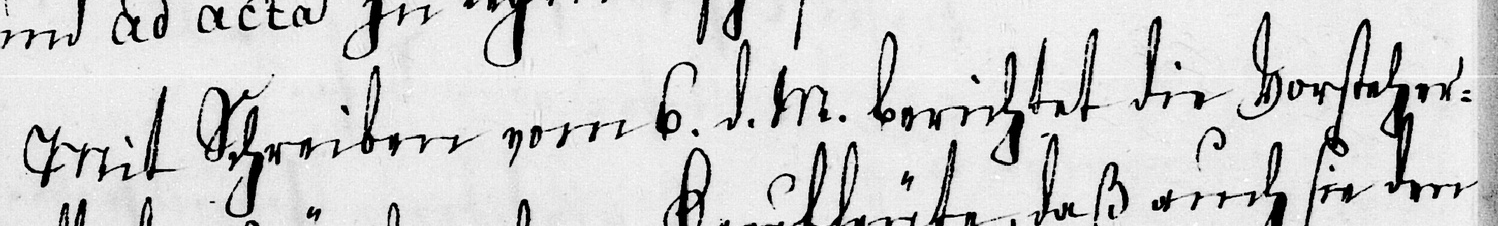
Mit Schreiben vom 6. d. M. berichtet die Vorsteher¬
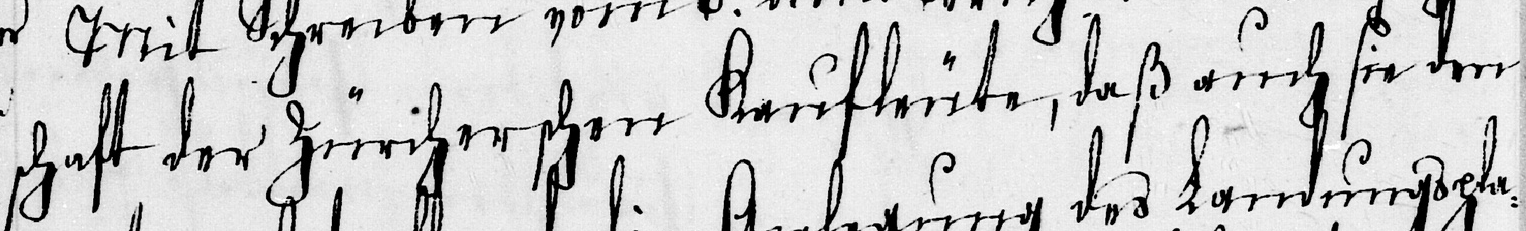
schaft der Zürcherschen Kaufleute, daß auch sie den
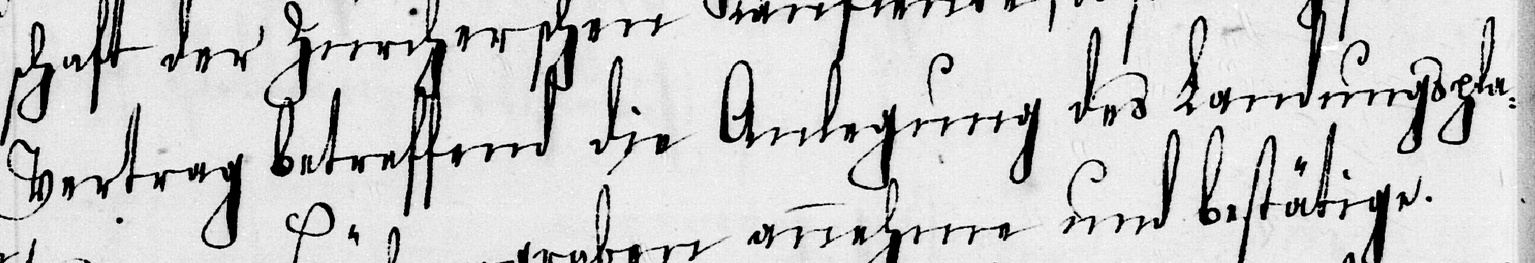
Vertrag betreffend die Anlegung des Landungspla¬
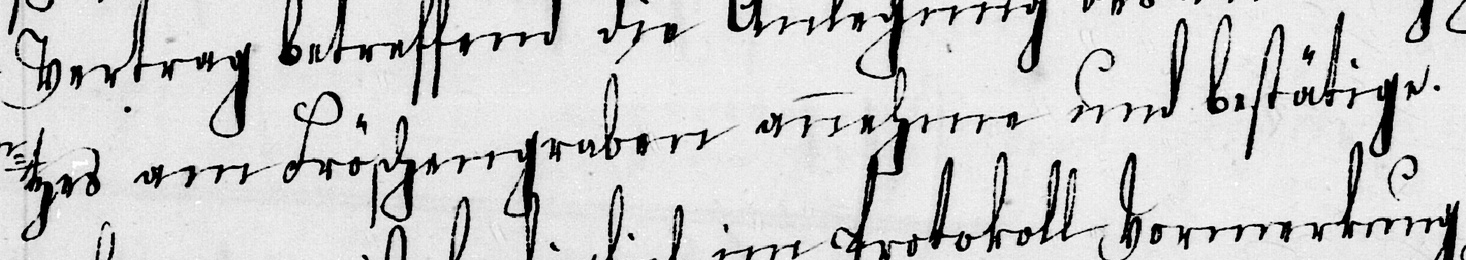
tzes am Fröschengraben annehme und bestätige.
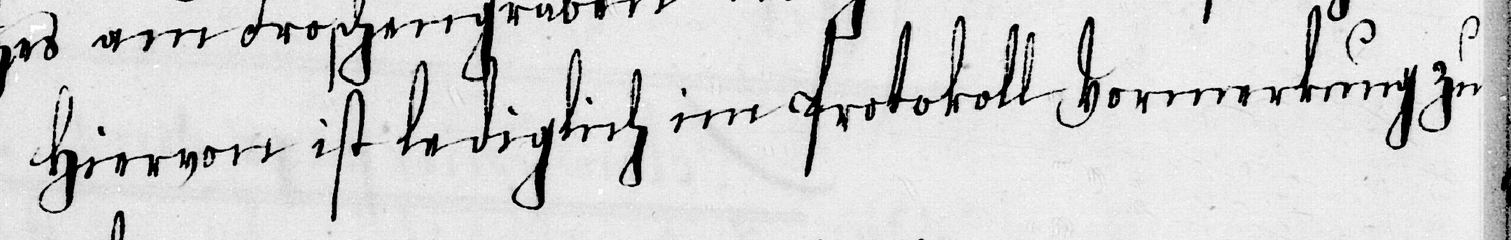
Hiervon ist lediglich im Protokoll Vormerkung zu
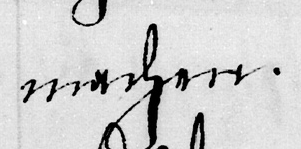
machen.
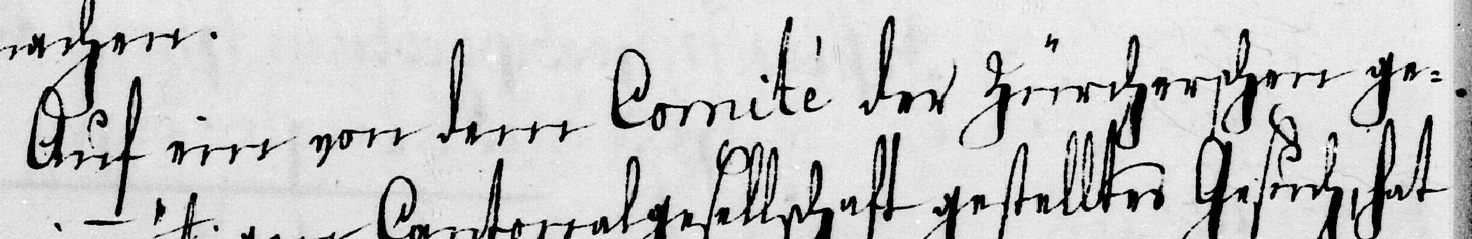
Auf ein von dem Comité der Zürcherschen ge¬
